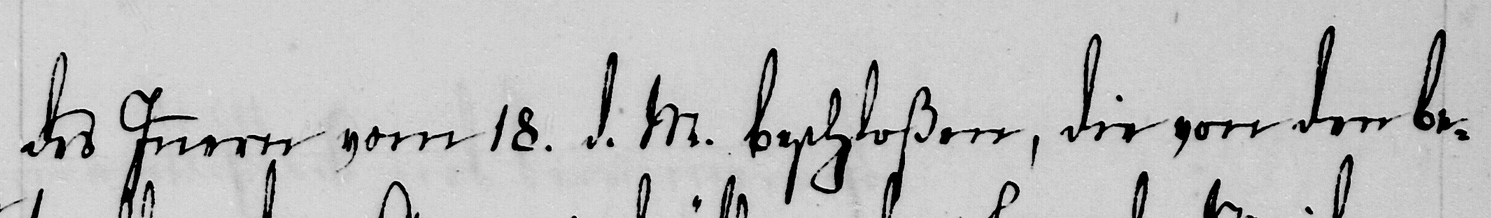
des Innern vom 18. d. M. beschloßen, die von den be¬
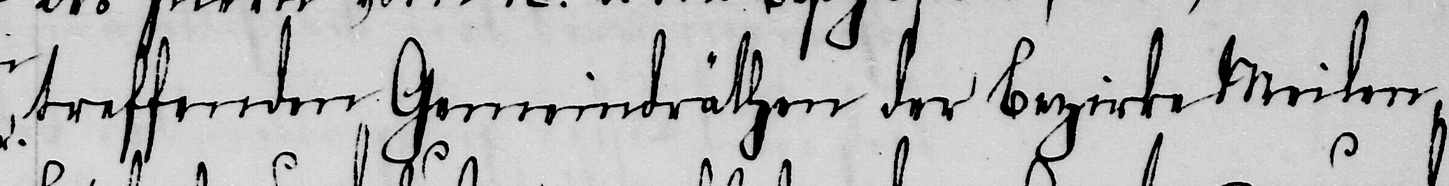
treffenden Gemeindräthen der Bezirke Meilen,
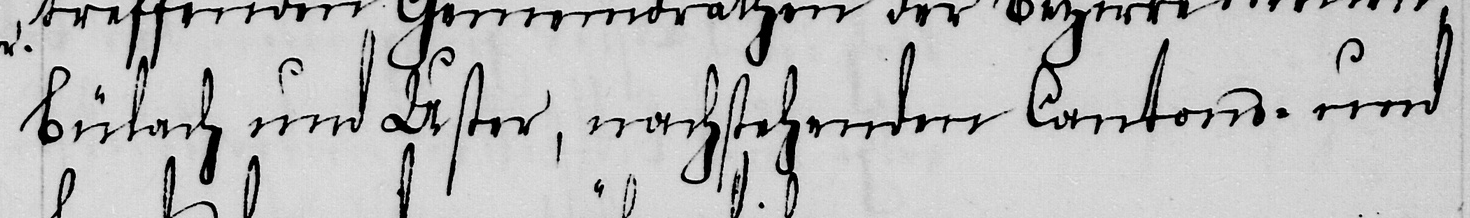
Bülach und Uster, nachstehenden Cantons- und
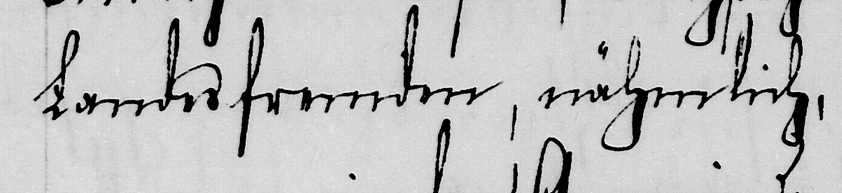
Landesfremden, nähmlich,
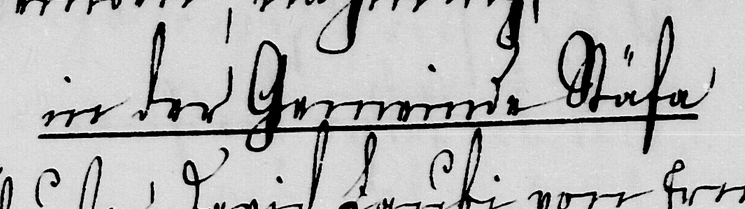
in der Gemeinde Stäfa
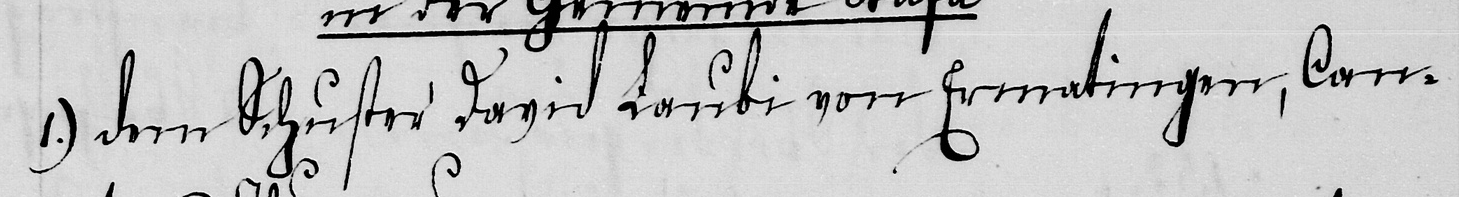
1.) dem Schuster David Laubi von Ermatingen, Can¬
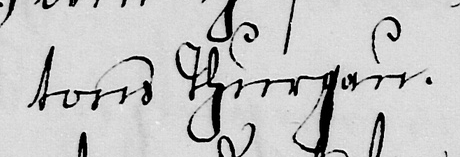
tons Thurgau.
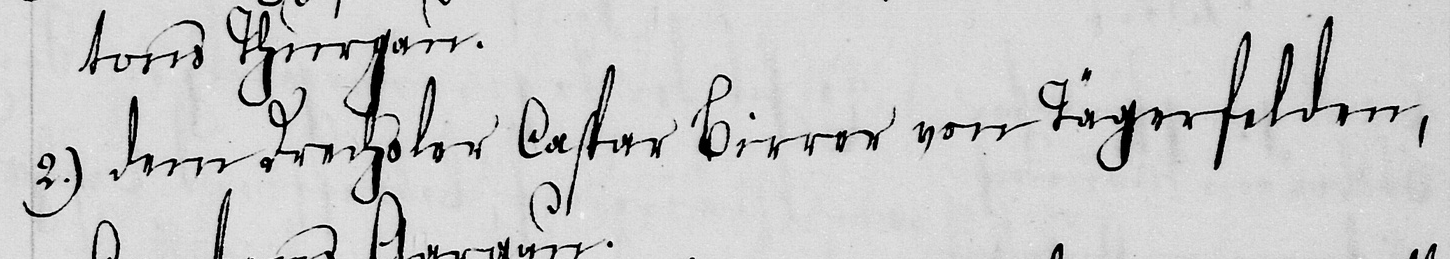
2.) dem Drechsler Caspar Birrer von Tägerfelden,
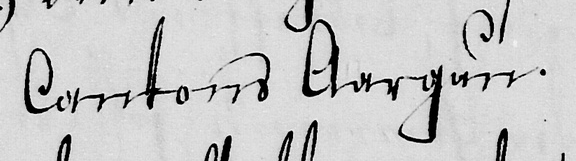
Cantons Aargau.
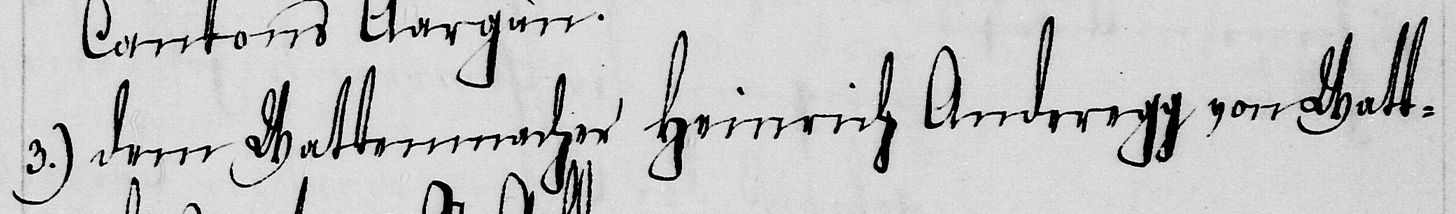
3.) dem Wattenmacher Heinrich Anderegg von Watt¬
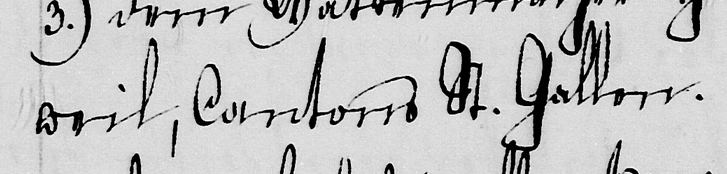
weil, Cantons St. Gallen.
